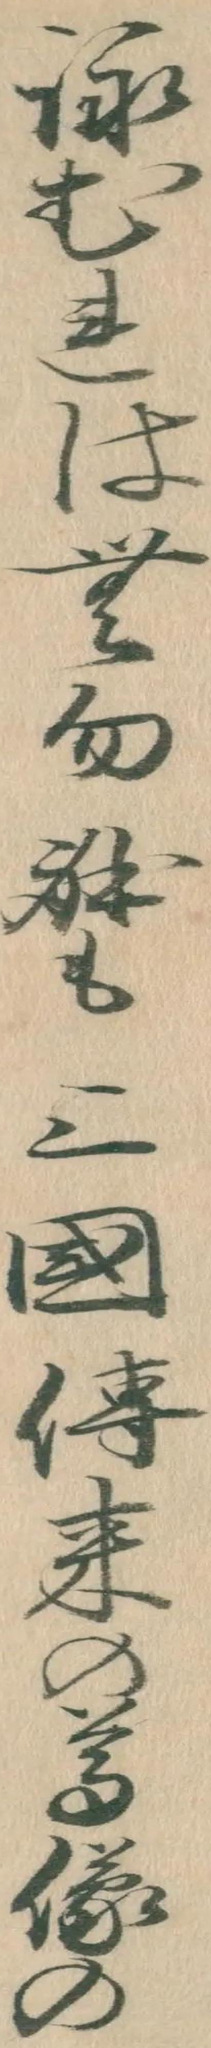詠むれは無勿体も三国伝来の尊像の

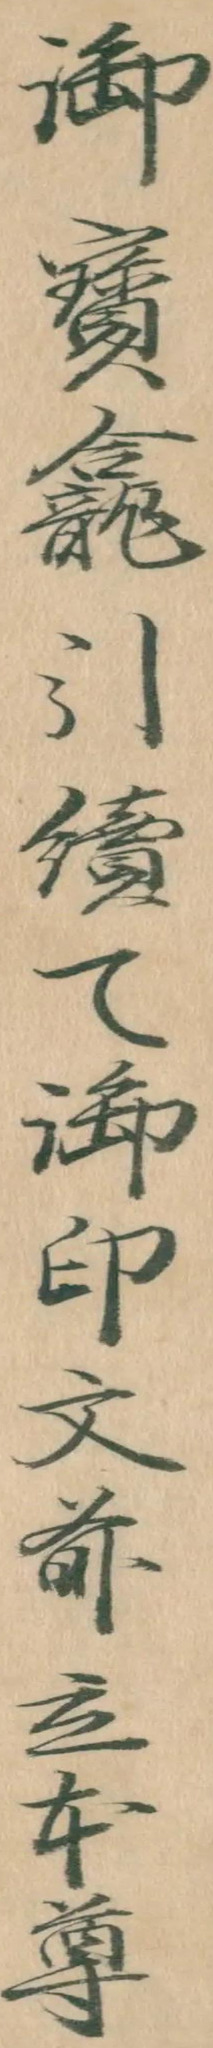御宝龕引続て御印文前立本尊
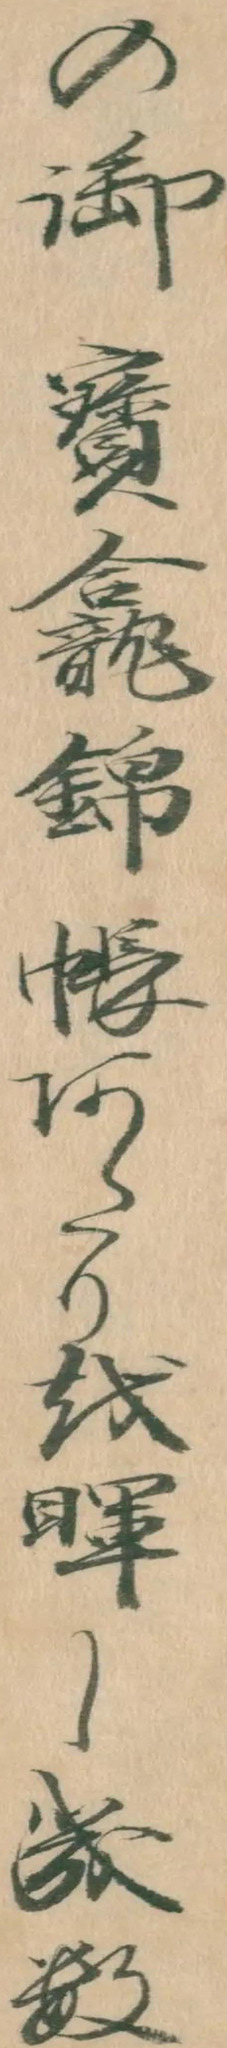の御宝龕錦帳あたりを暉し幾数
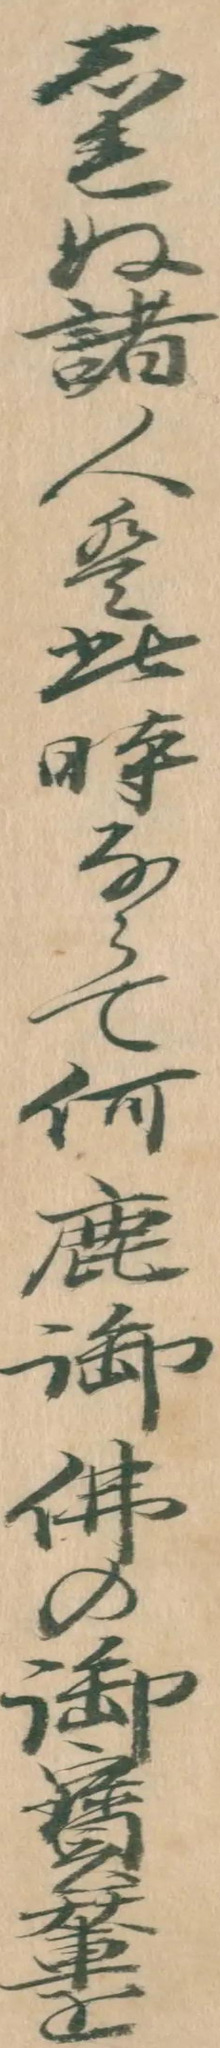しれぬ諸人は此時ならて何鹿御仏の御宝輦を
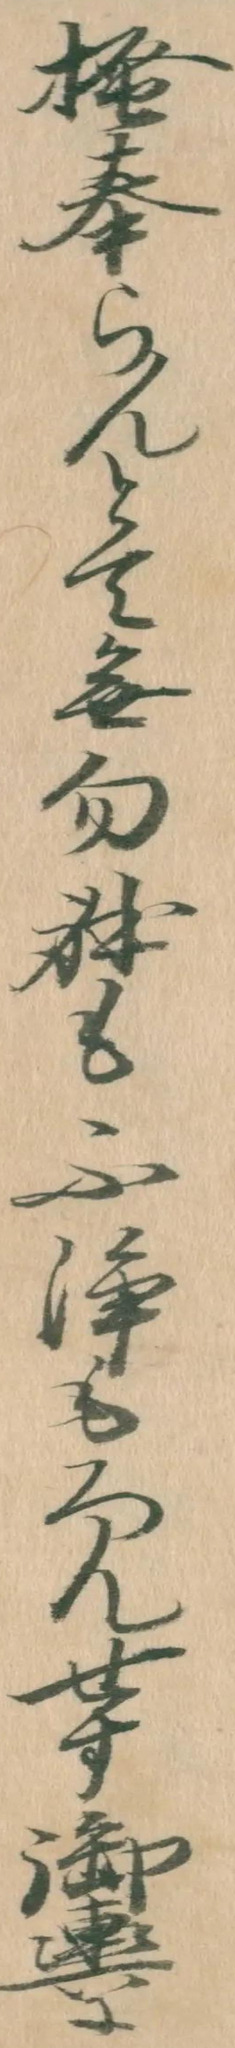搔奉らんとて無勿体も不浄もろんせす御輿に
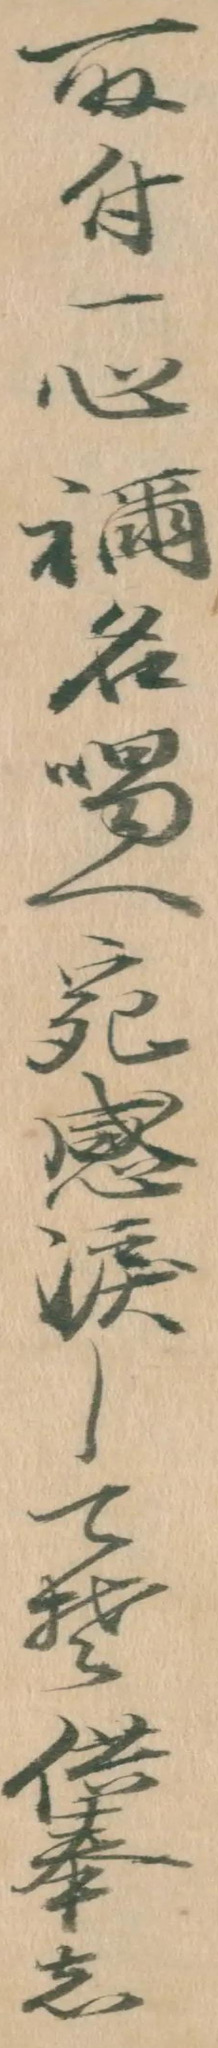取付一心称名唱へ宛感涙してそ供奉し
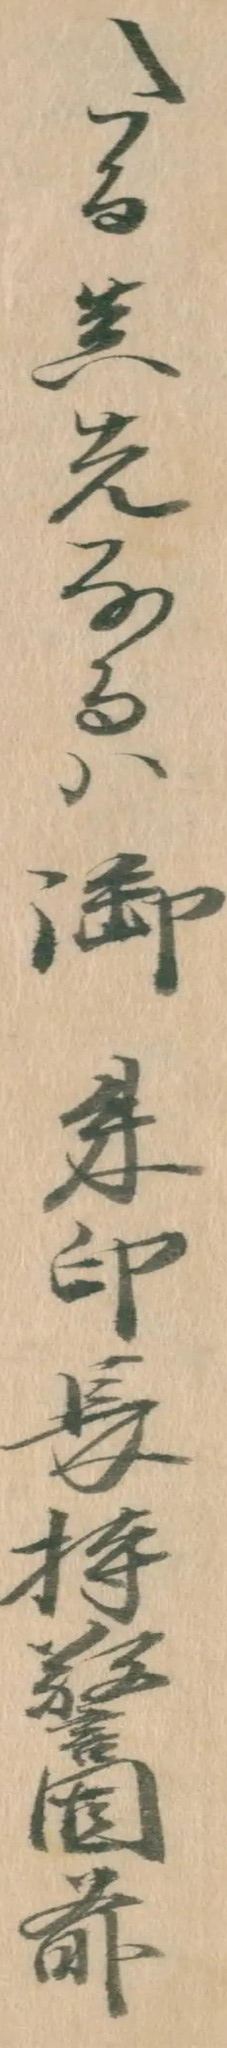たる真先なるは御朱印長持警固前
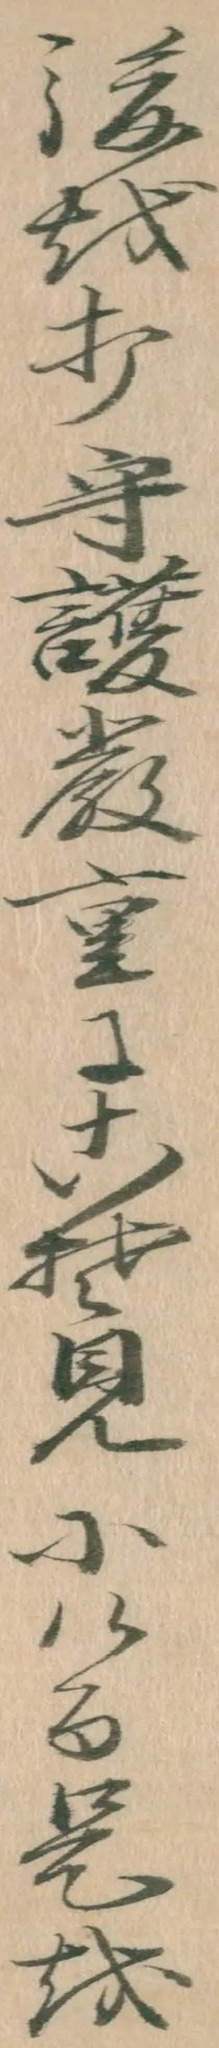後を打守護厳重にこそ見にける是を
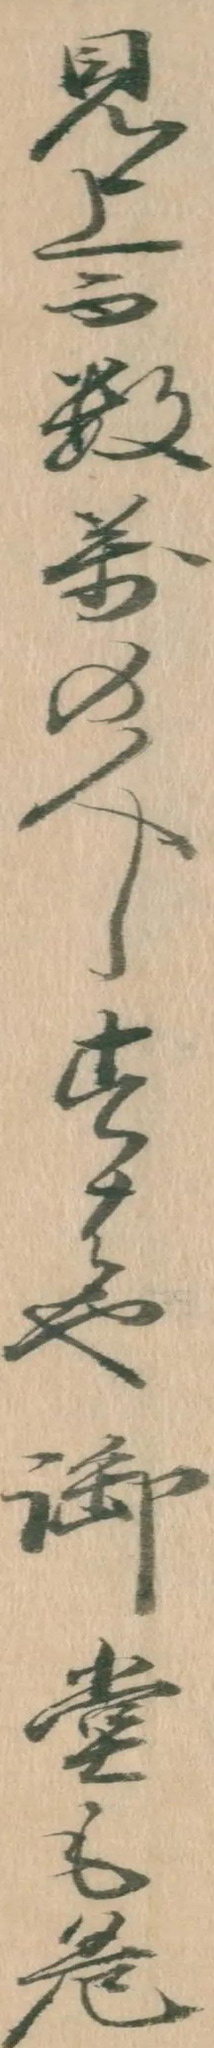見上て数万の人〳〵すはや御堂も危
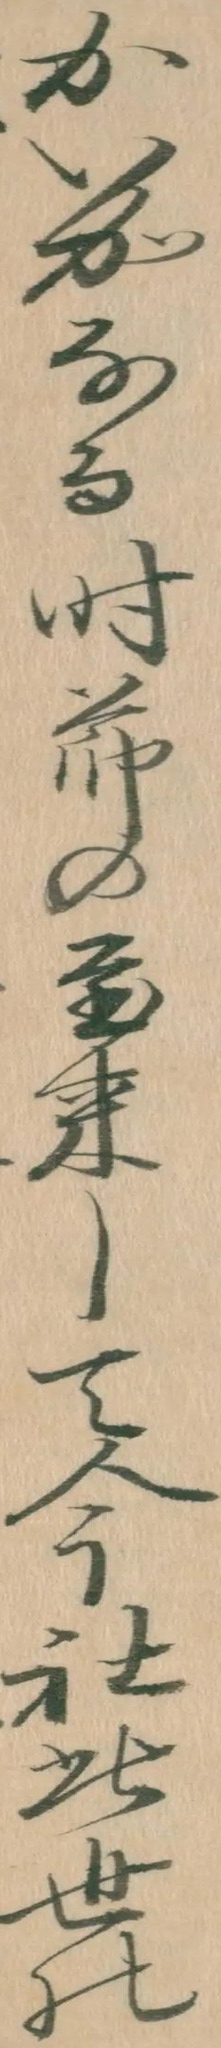かいかなる時節の到来して今社此世の
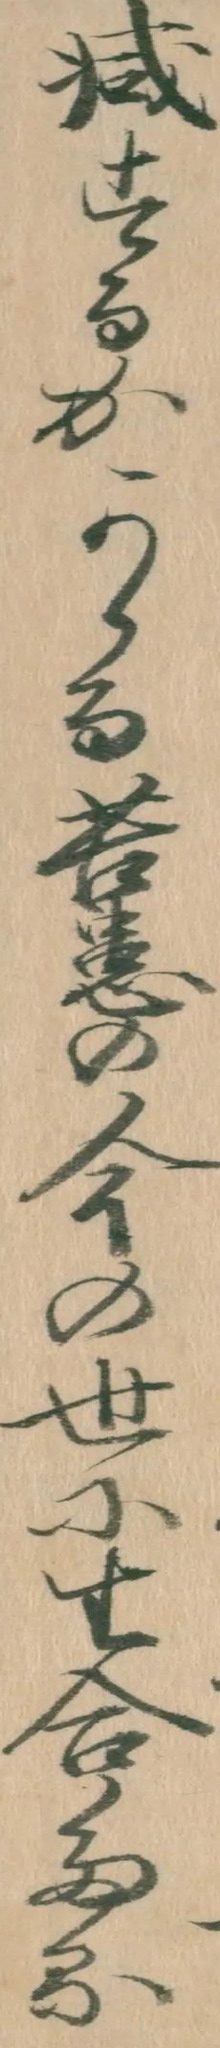滅するかかゝる苦患の今の世に生合たる
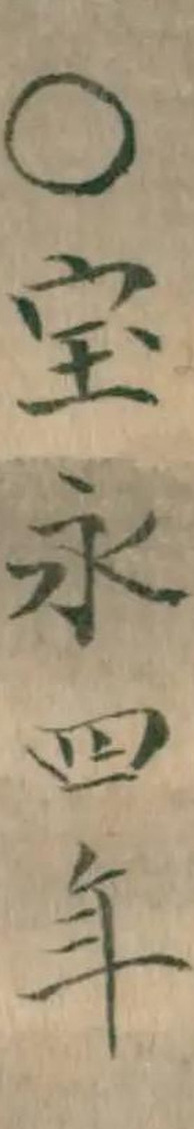○宝永四年
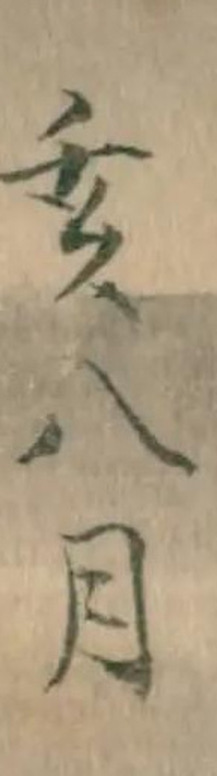亥八月
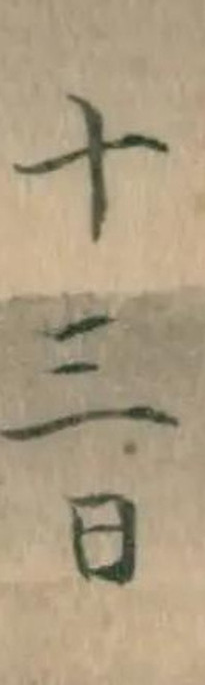十三日
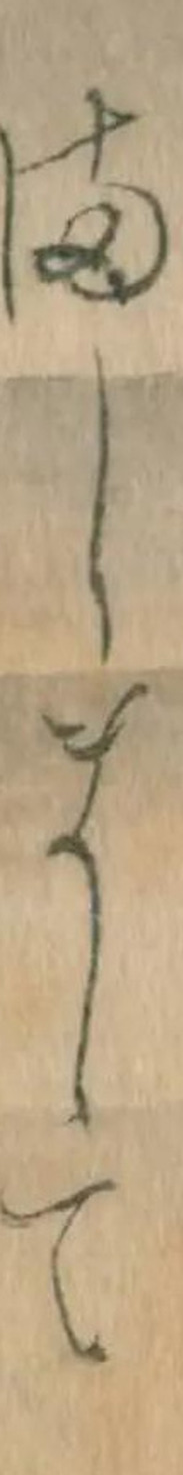ましまして
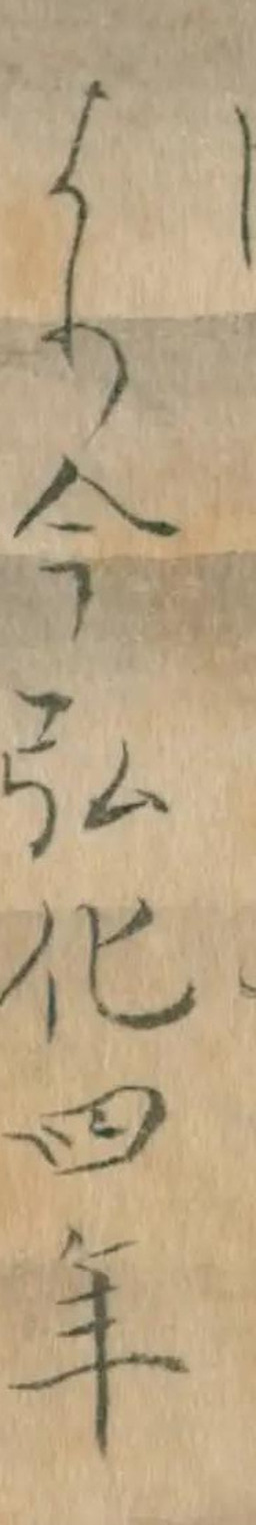より今弘化四年
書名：俗語之種. [3]
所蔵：国立国会図書館 National Diet Library, JAPAN
